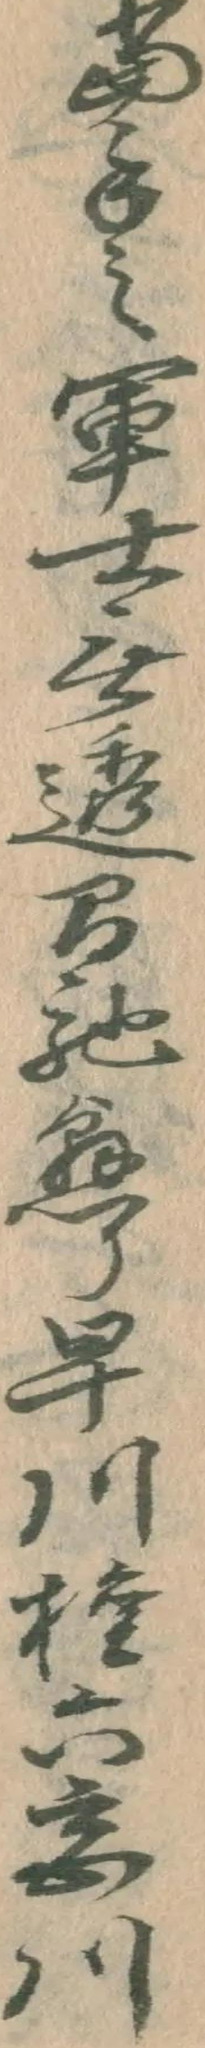当手之軍士無透間馳懸り早川権六宮川
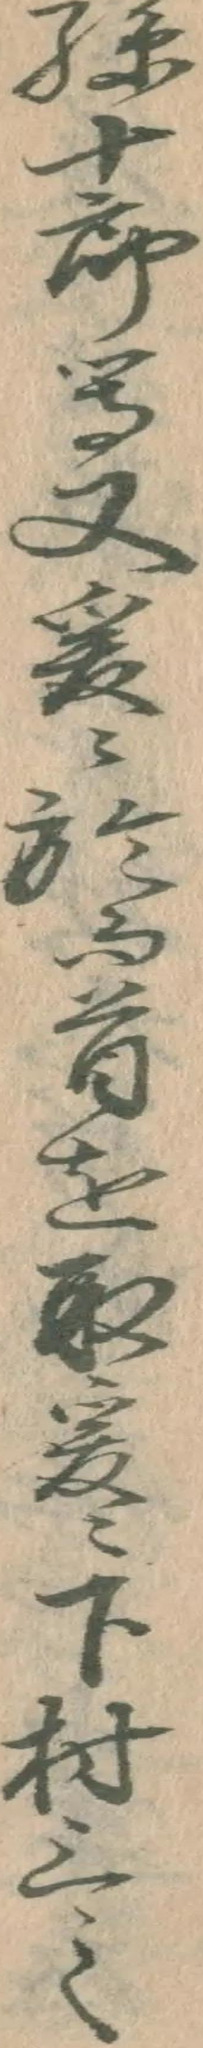孫十郎等又爰に於而首を取爰に下村三之
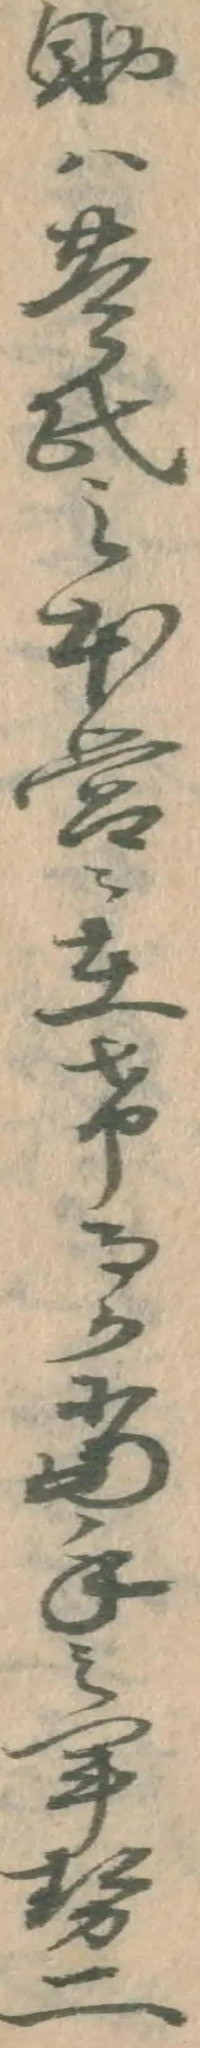助は豊氏之本営に在希るか当手之軍勢二
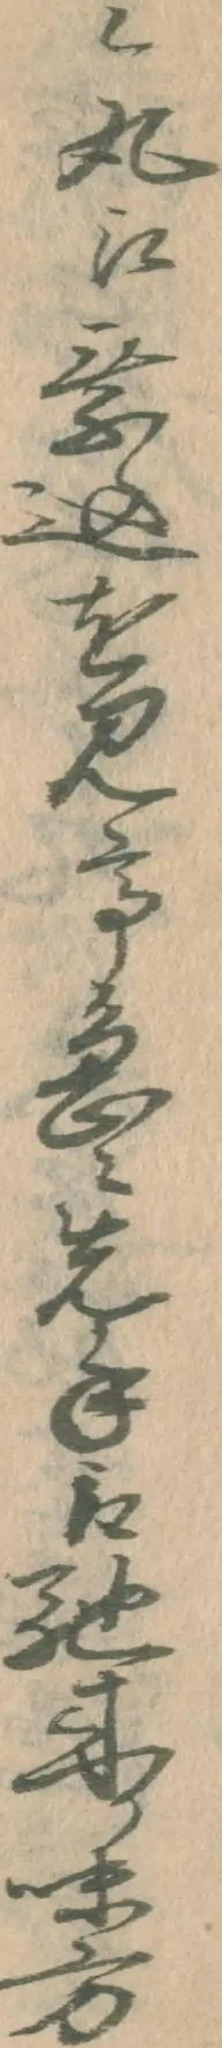之丸江乗込を見亭急に先手江馳来り味方

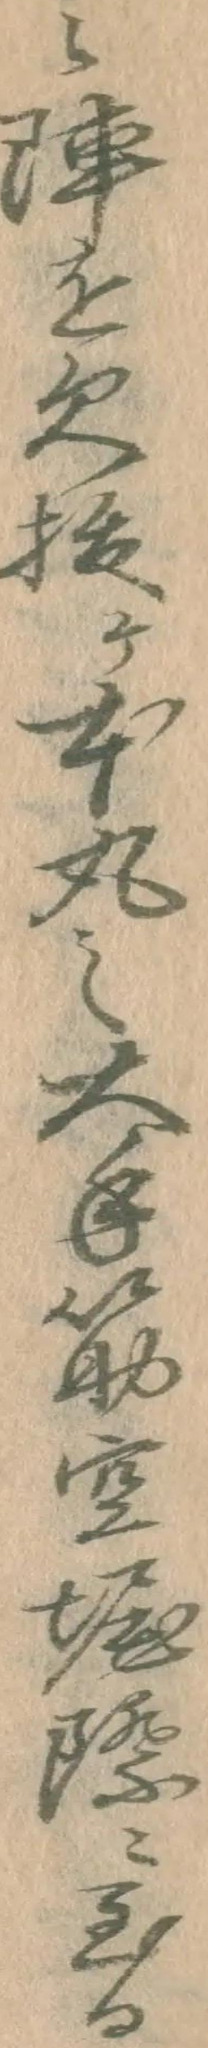之陣を欠抜け本丸之大手筋空堀際に至る
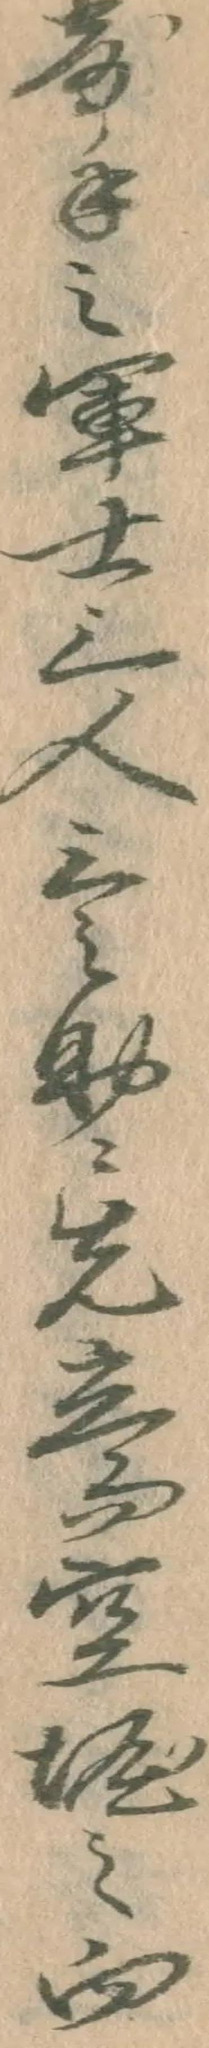寄手之軍士三人三之助に先立而空堀之向
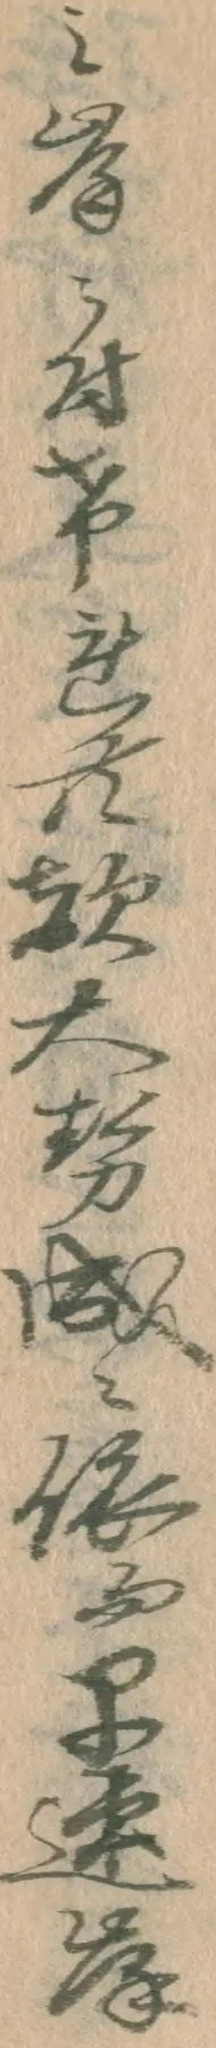之岸に付希連共敵大勢成に依而早速岸
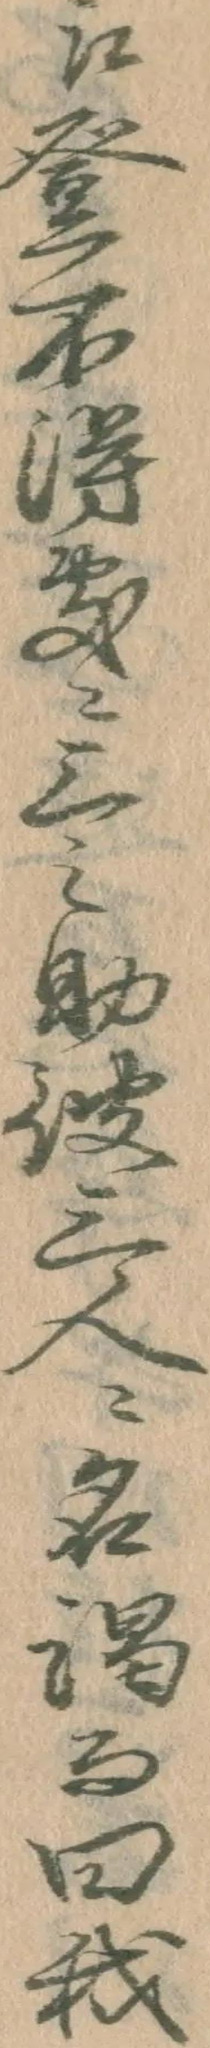江登不得處に三之助彼三人に名謁而曰我
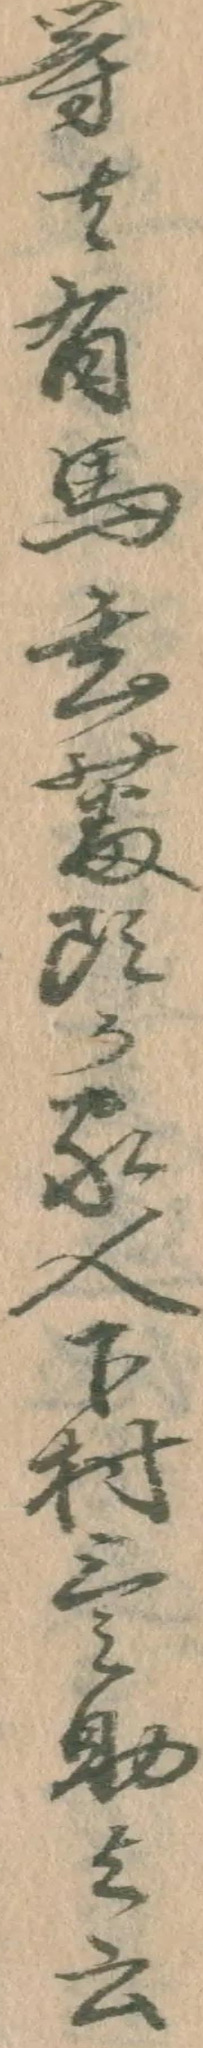等者有馬玄蕃頭か家人下村三之助与云
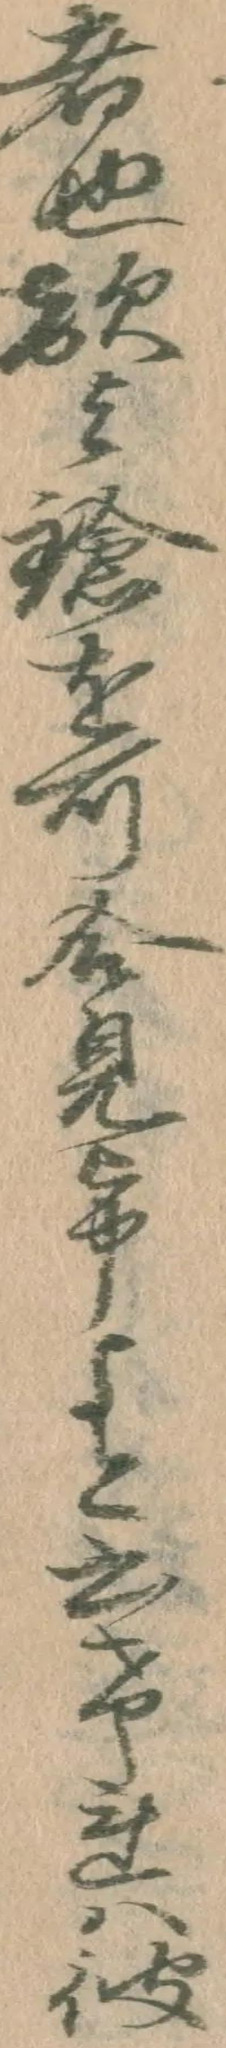者也敵与鎗を可合見被申よと云希連は彼
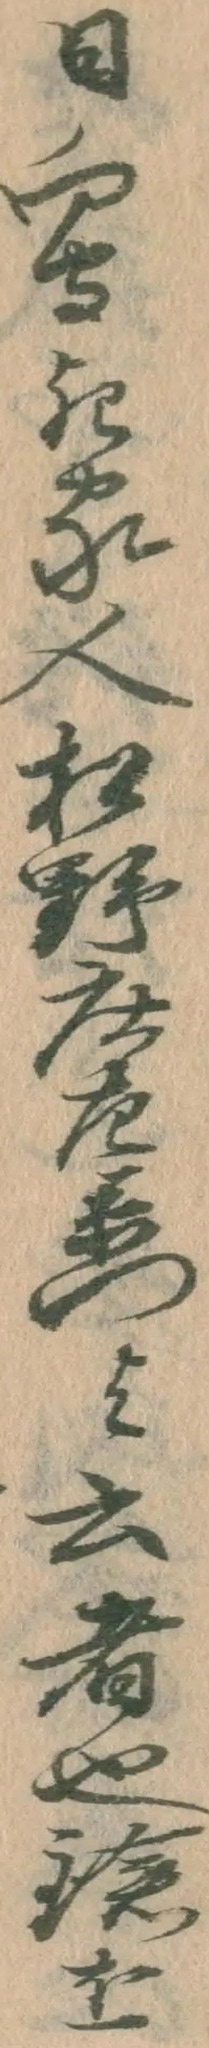日向守歟家人松野庄左衛門与云者也鎗を
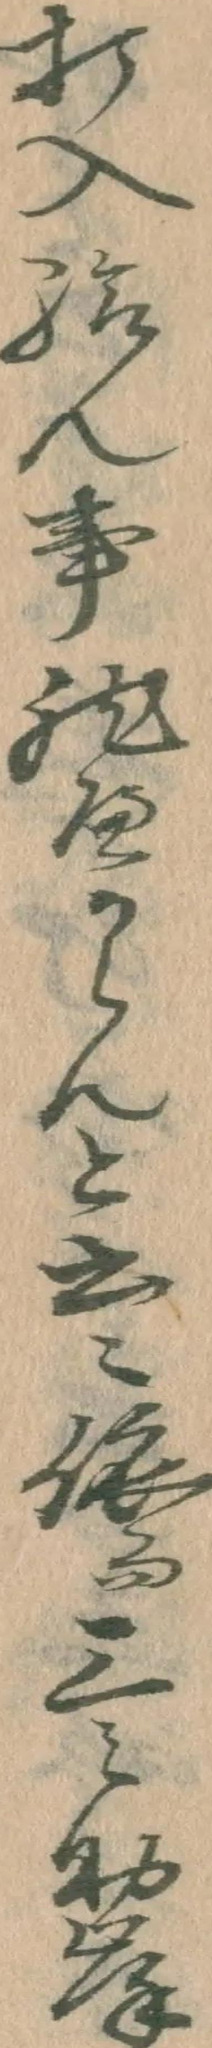打入給ん事然扁からんと云に依而三之助岸
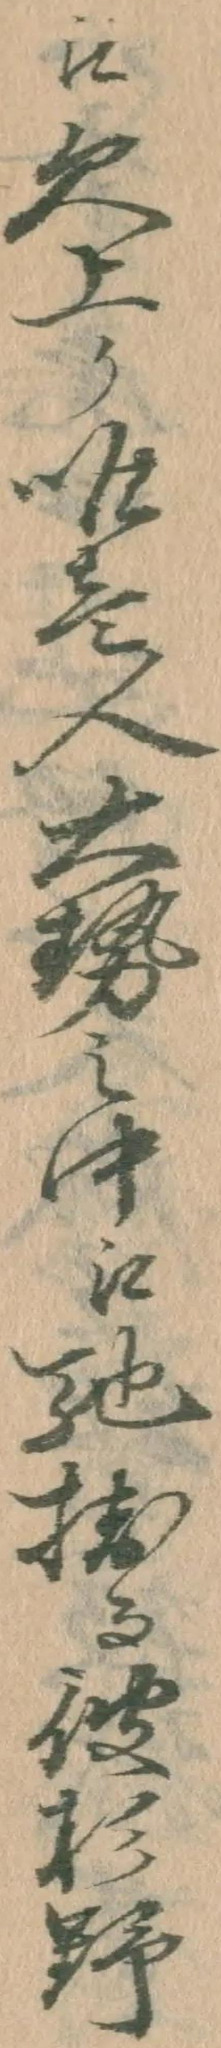江欠上り唯壱人大勢之中江馳掛る彼杉野
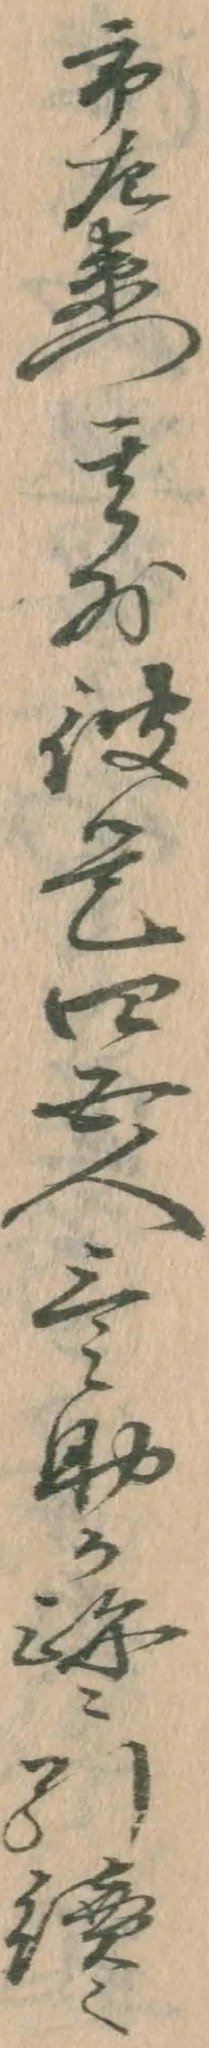市左衛門其外彼是四五人三之助か跡に引続く
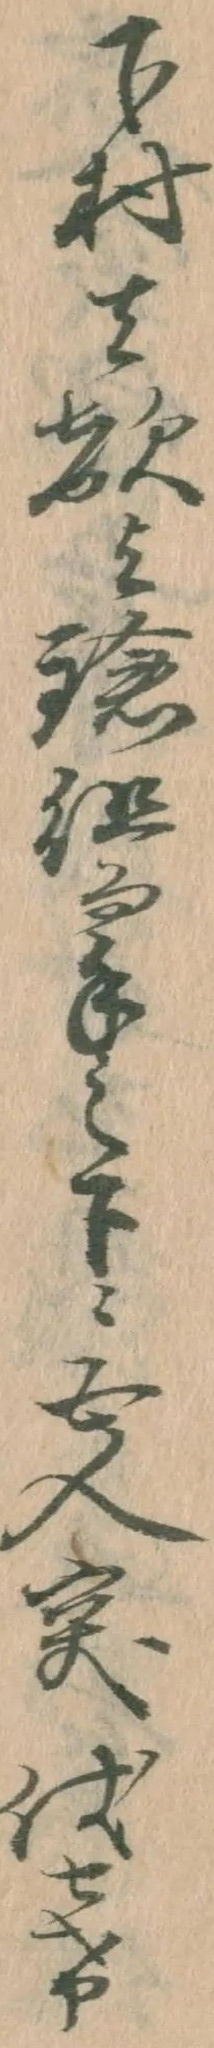下村者敵与鎗組而手之下に五人突伏せ希
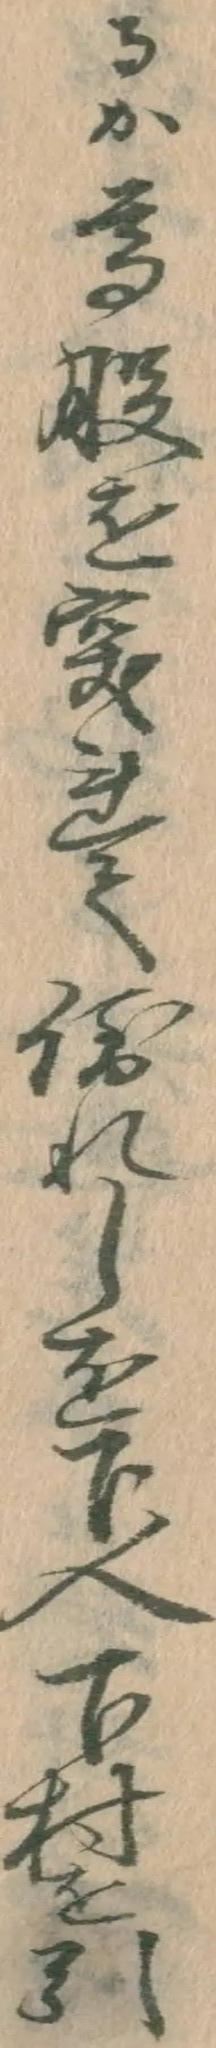るか高股を突連て倒れしを下人下村を引
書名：切支丹御退治記 49巻. [8]
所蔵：国立国会図書館 National Diet Library, JAPAN
